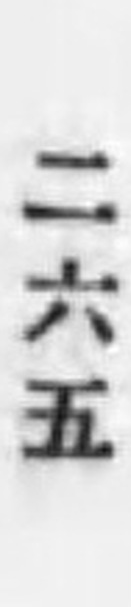二六五

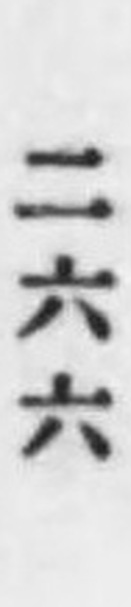二六六
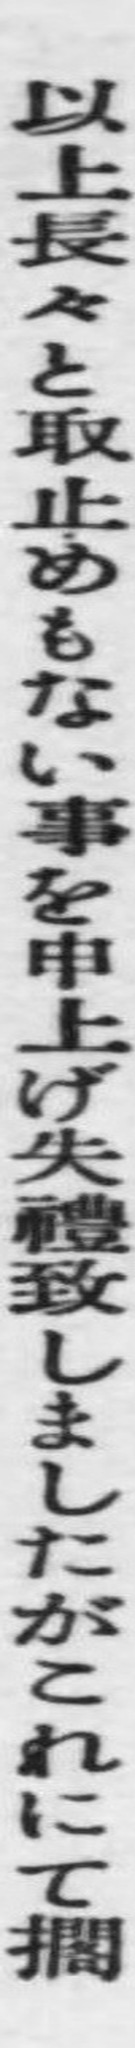以上長々と取止めもない事を申上げ失礼致しましたがこれにて擱
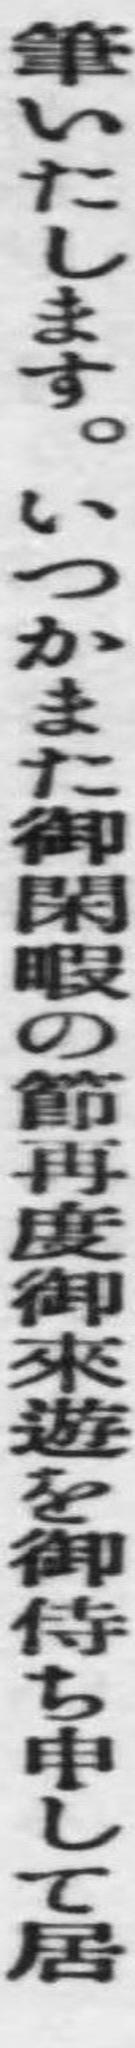筆いたします。いつかまた御閑暇の節再度御来遊を御侍ち申して居
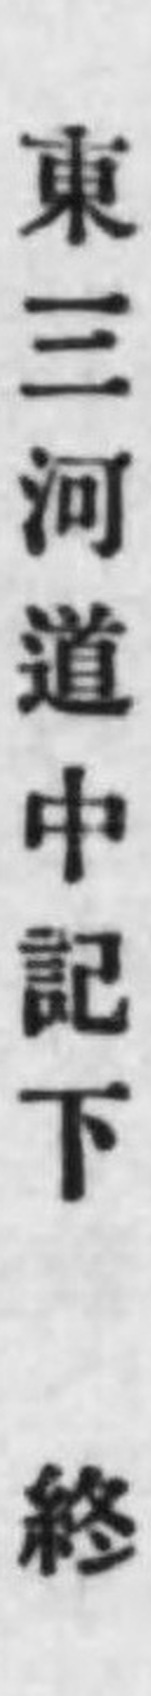東三河道中記下終
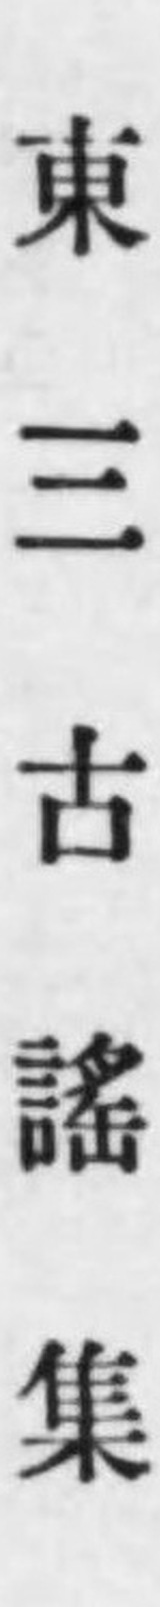東三古謡集
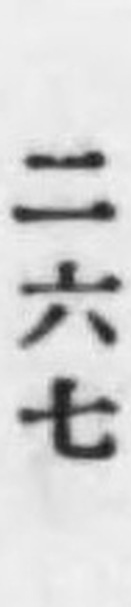二六七

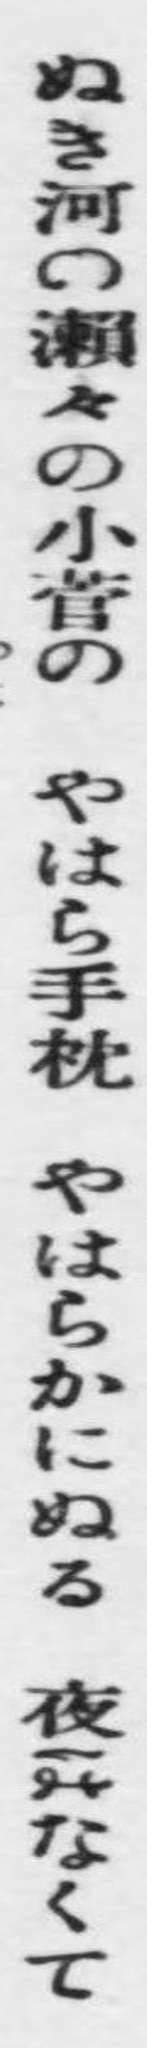ぬき河の瀬々の小菅のやはら手枕やはらかにぬる夜はなくて
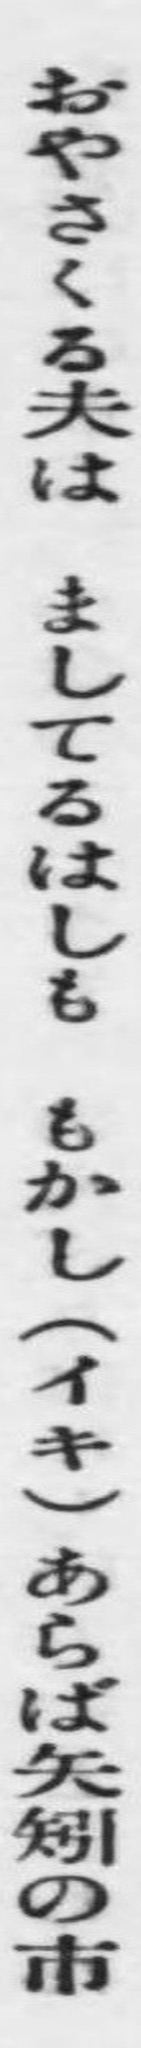おやさくる夫はましてるはしももかし(イキ)あらば矢矧の市
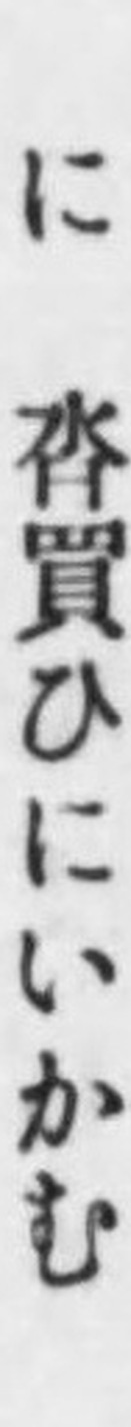に沓買ひにいかむ
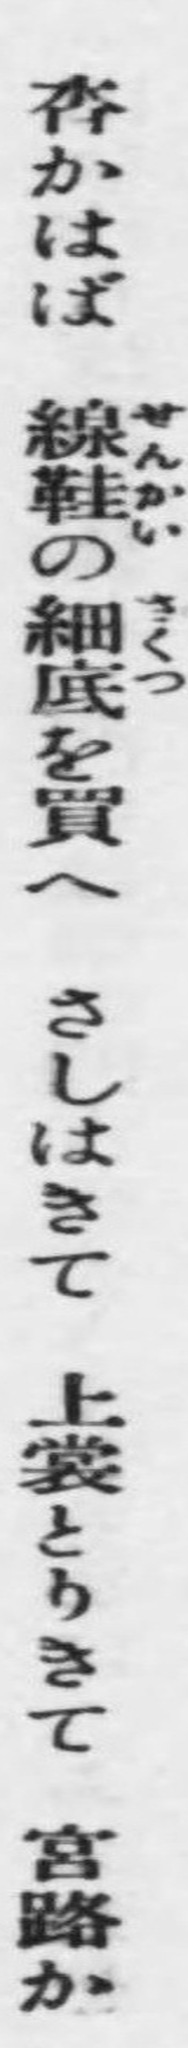沓かはば線鞋の細底を買へさしはきて上裳とりきて宮路か
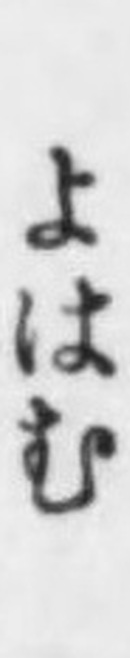よはむ

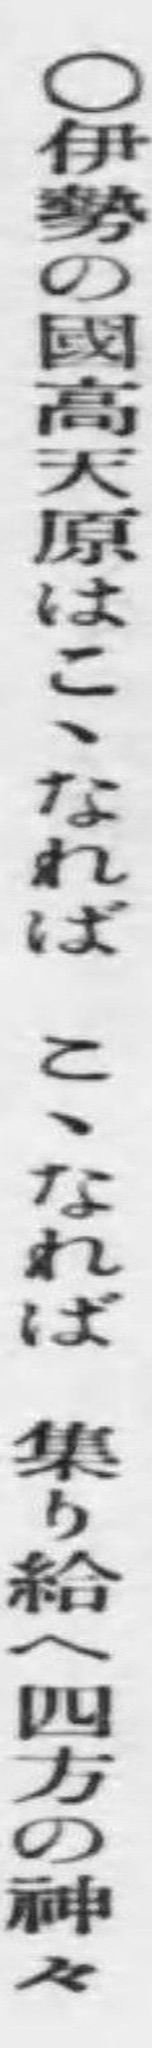○伊勢の國高天原はこヽなればこヽなれば集り給へ四方の神々
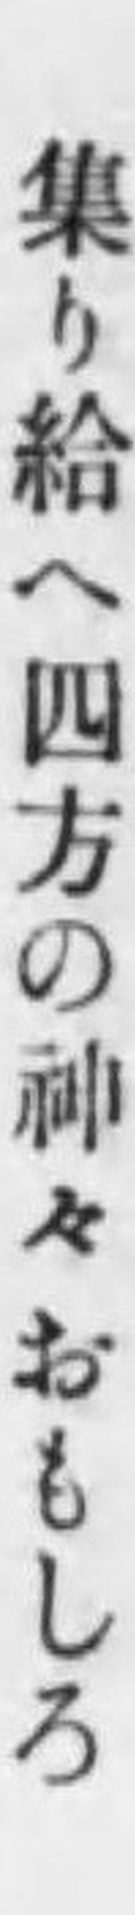集り給へ四方の神々おもしろ
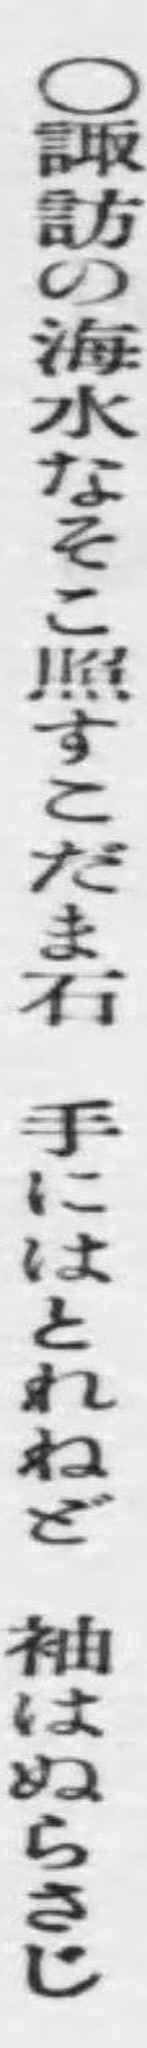○諏訪の海水なそこ照すこだま石手にはとれねど袖はぬらさじ
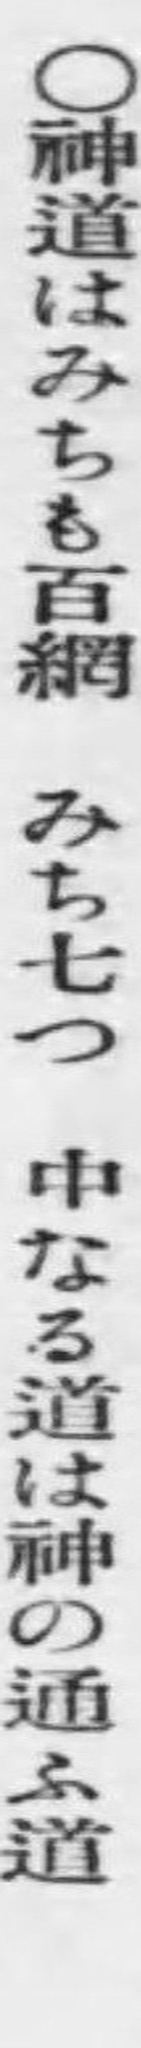○神道はみちも百網みち七つ中なる道は神の通ふ道
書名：東三河道中記 : 豊橋市及其附近案内
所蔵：国立国会図書館 National Diet Library, JAPAN
